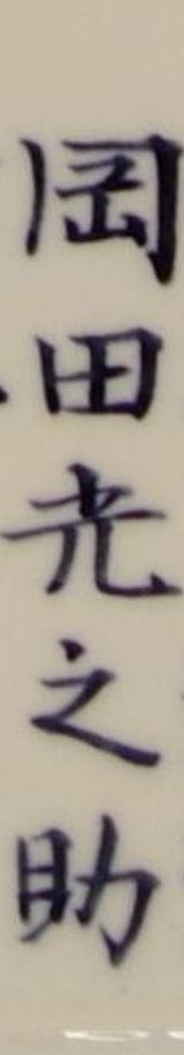岡田光之助
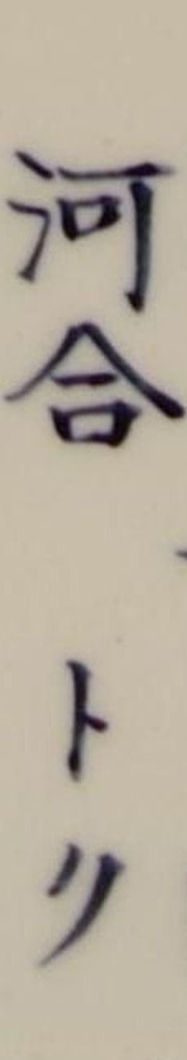河合トク
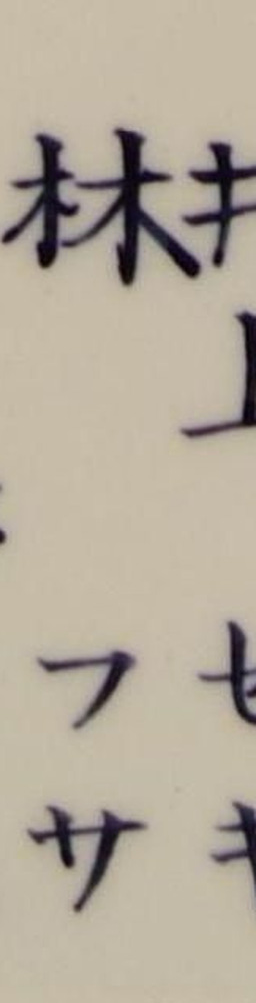林フサ
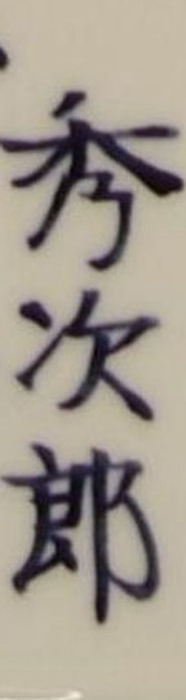秀次郎
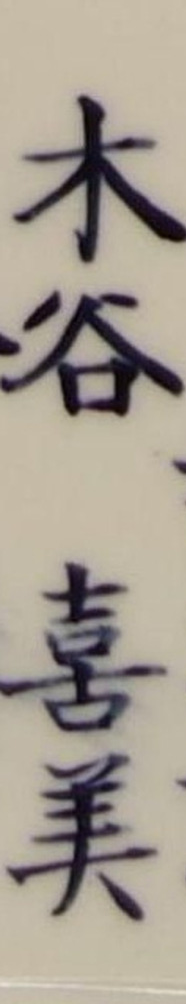木谷喜美
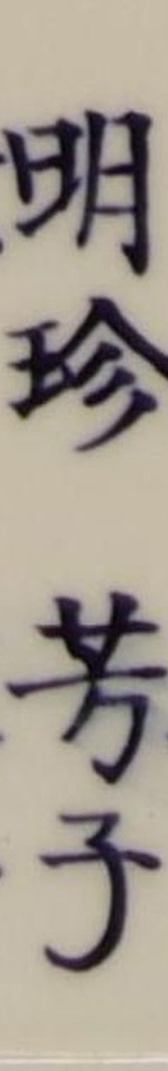明珍芳子
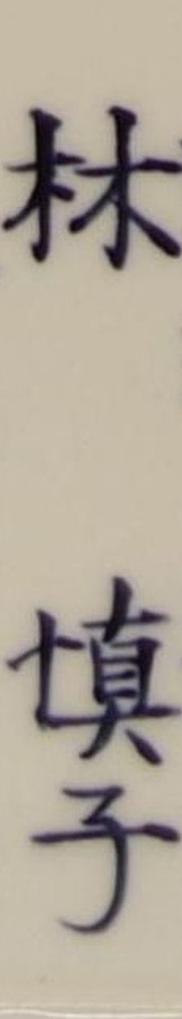林慎子
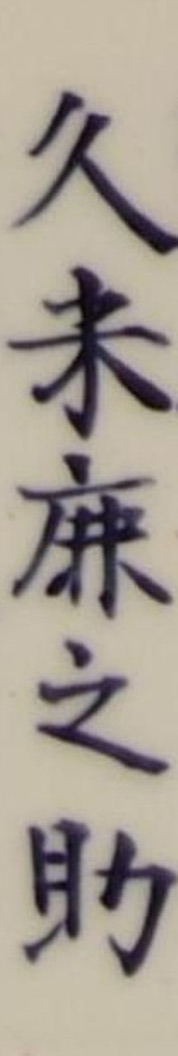久米廉之助
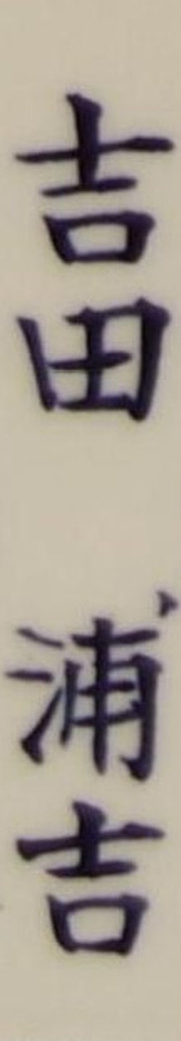吉田浦吉
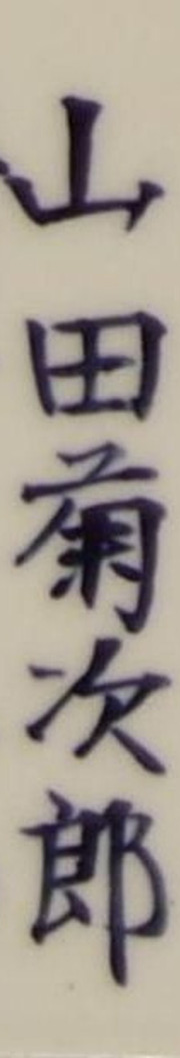山田菊次郎
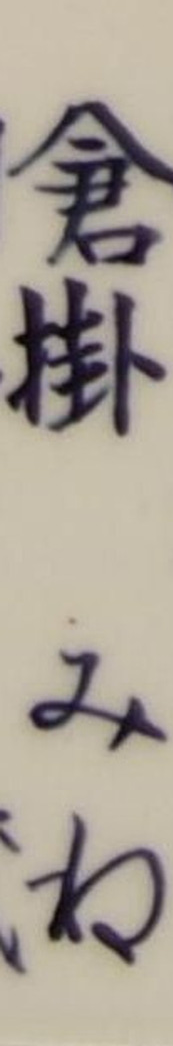倉掛みね
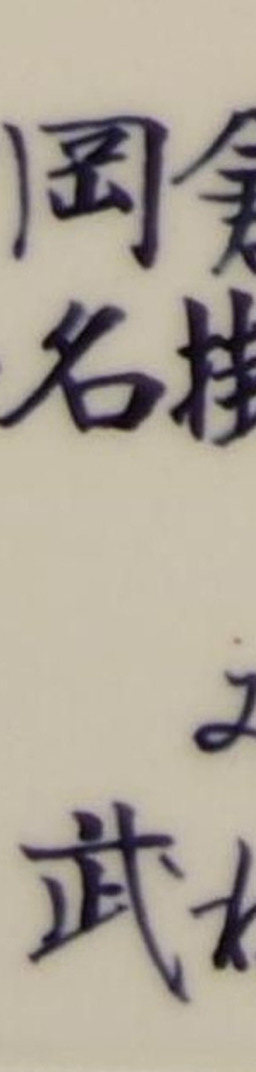岡名武

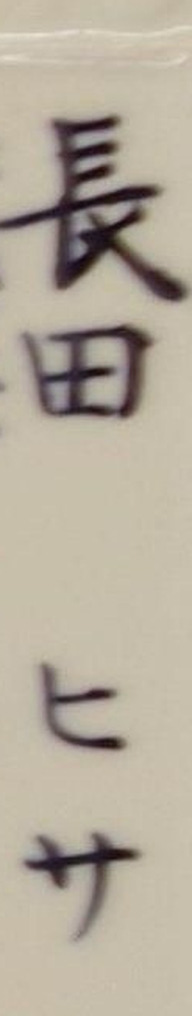長田ヒサ
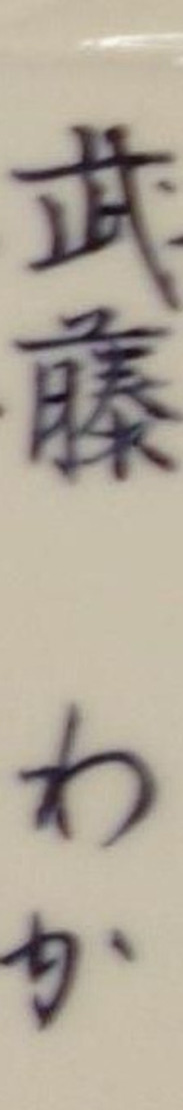武藤わか
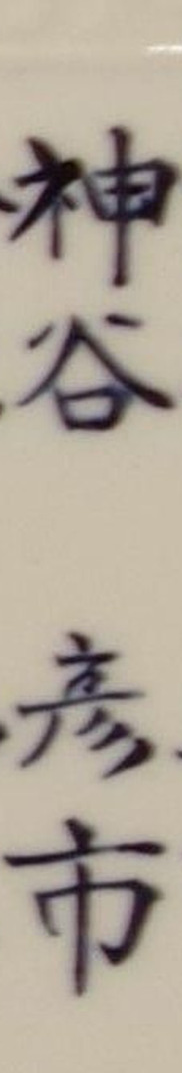神谷彦市
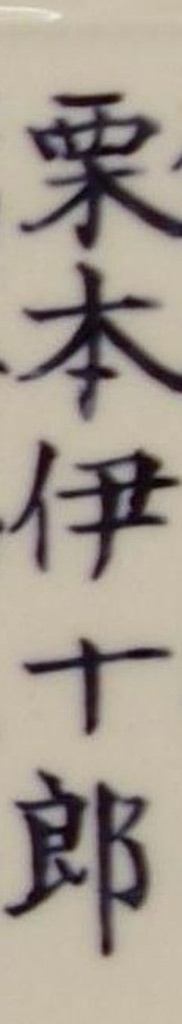栗本伊十郎
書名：E~L
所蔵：高野山金剛峯寺
